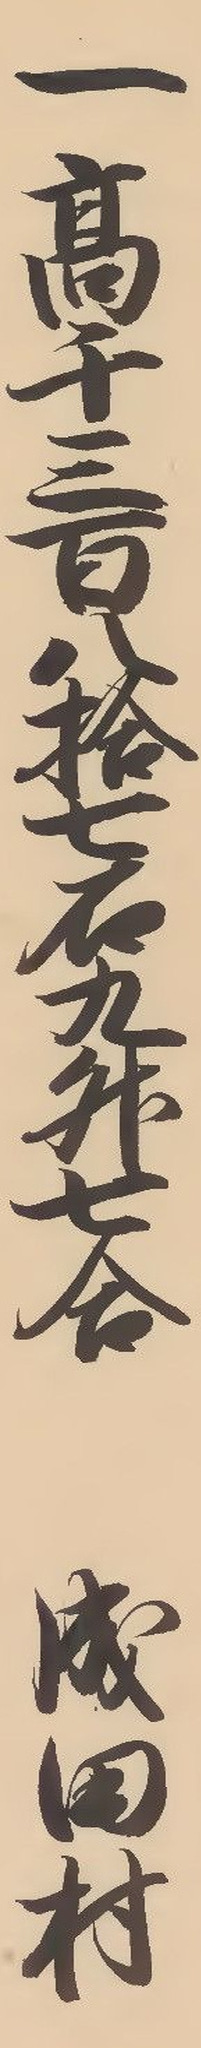一高千三百八拾七石九升七合成田村
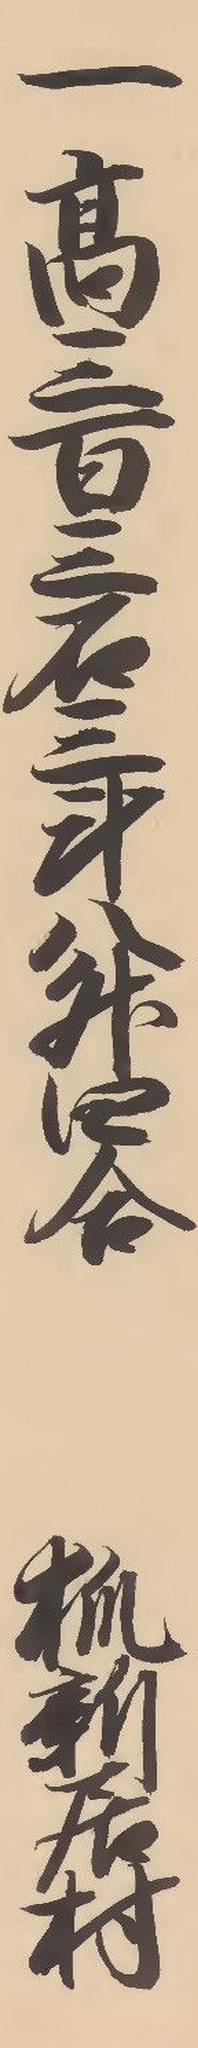一高三百三石三斗八升四合狐新居村
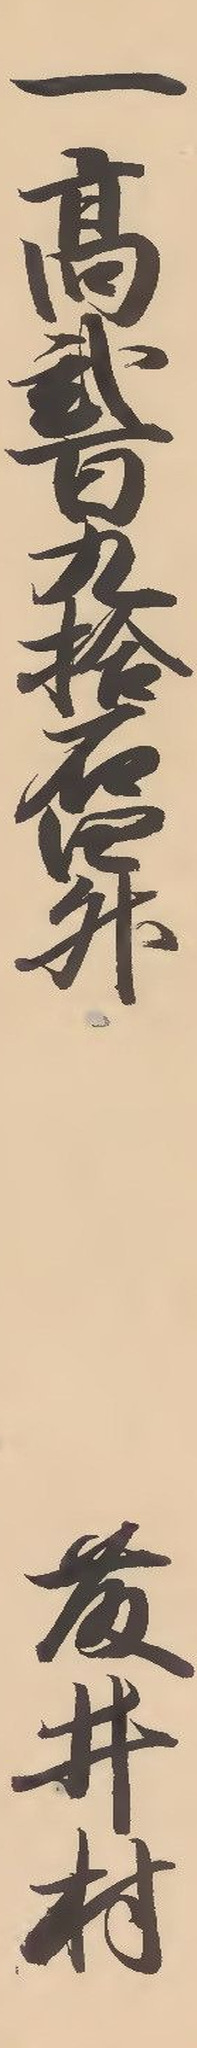一高弐百九拾石四升藤井村
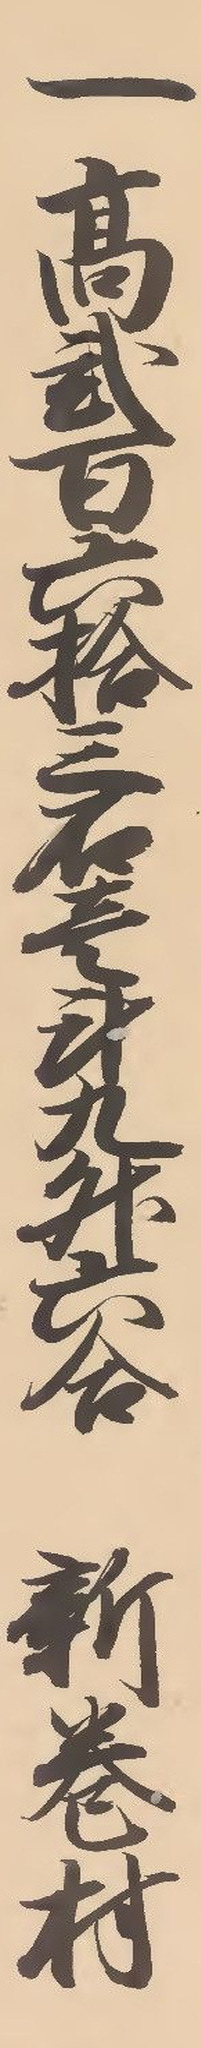一高弐百六拾三石壱斗九升六合新巻村
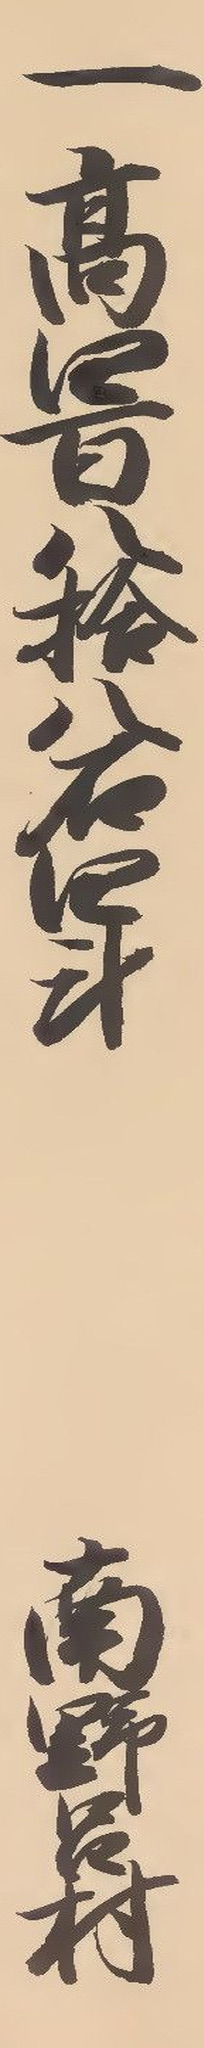一高四百八拾八石四斗南野呂村
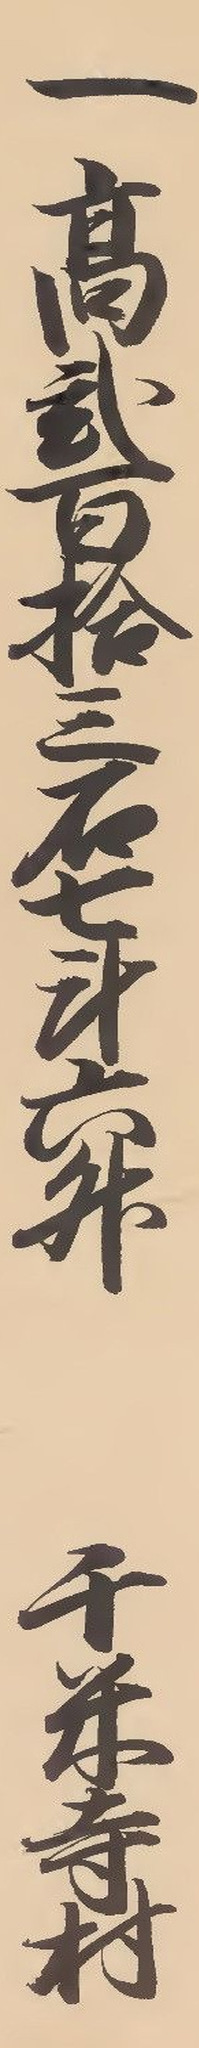一高弐百拾三石七斗六升千米寺村
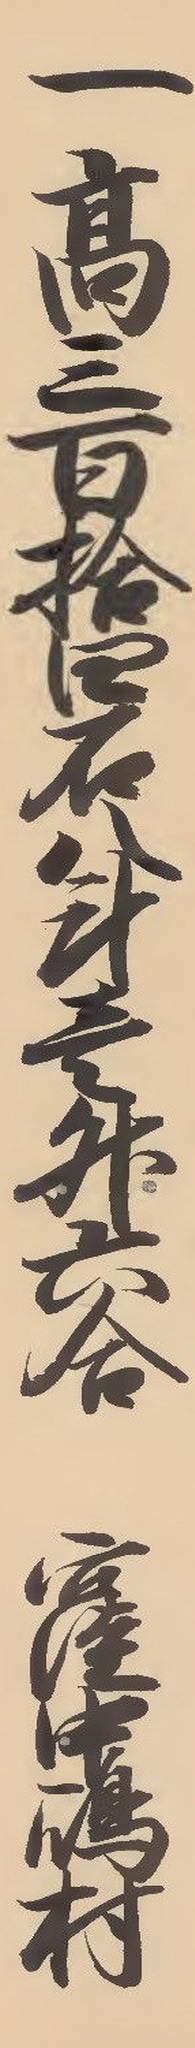一高三百拾四石八斗壱升六合窪中島村

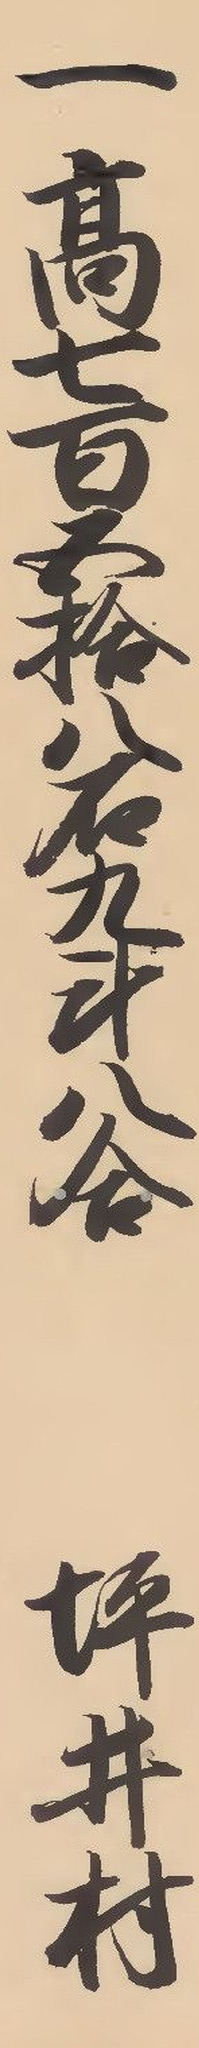一高七百五拾八石九斗八合坪井村
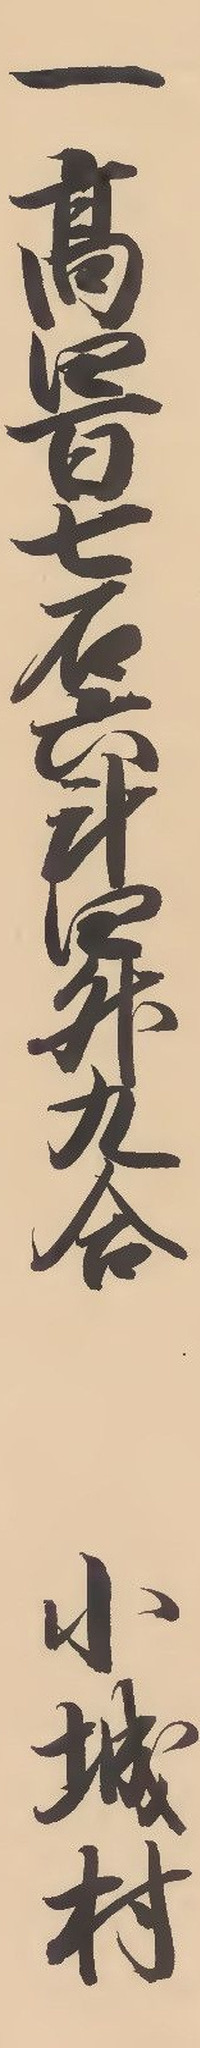一高四百七石六斗四升九合小城村
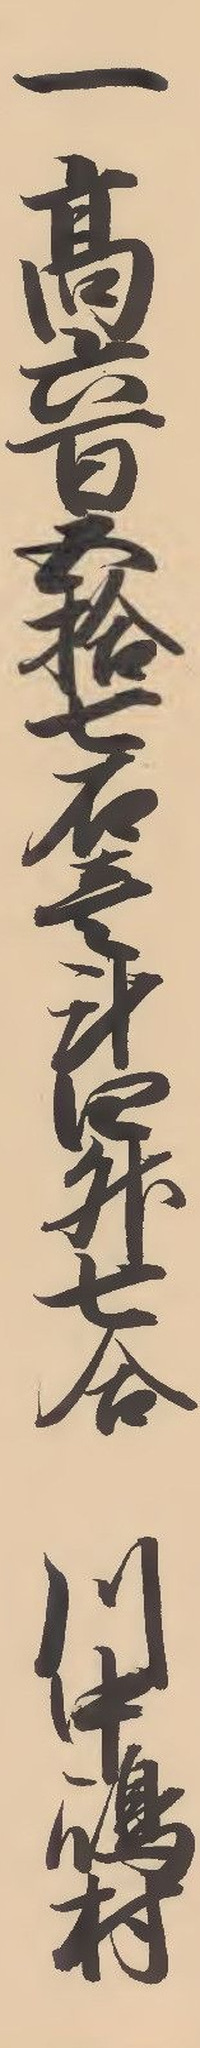一高六百五拾七石壱斗四升七合川中島村
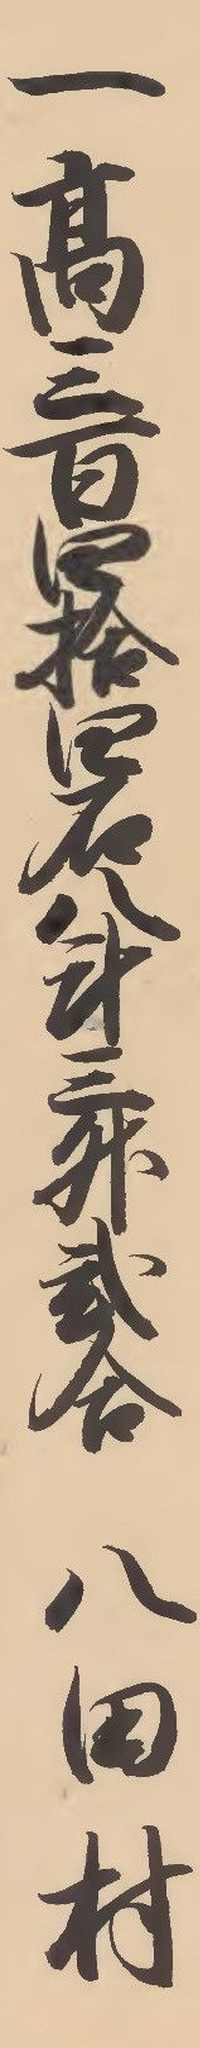一高三百四拾四石八斗三升弐合八田村
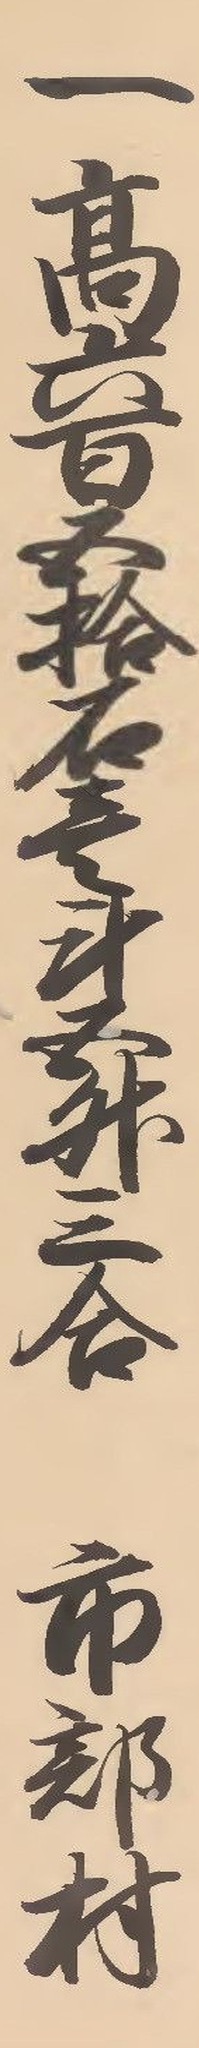一高六百五拾石壱斗五升三合市部村
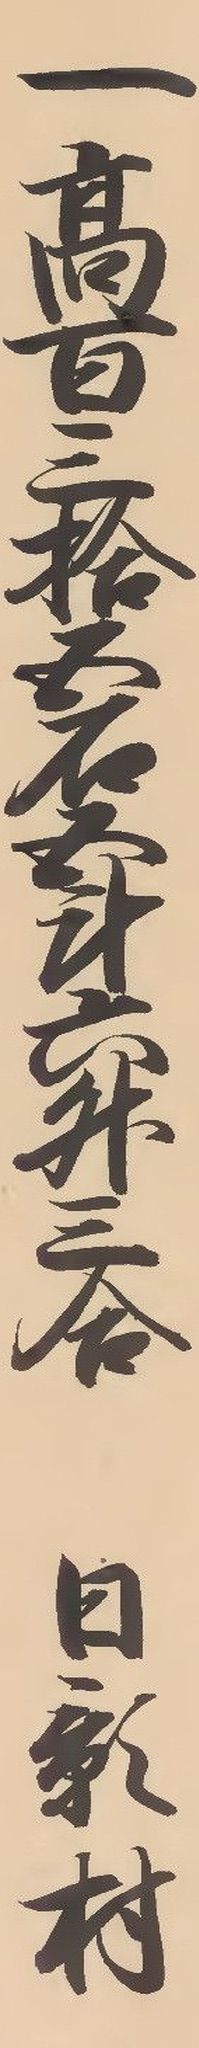一高百三拾五石五斗六升三合日影村
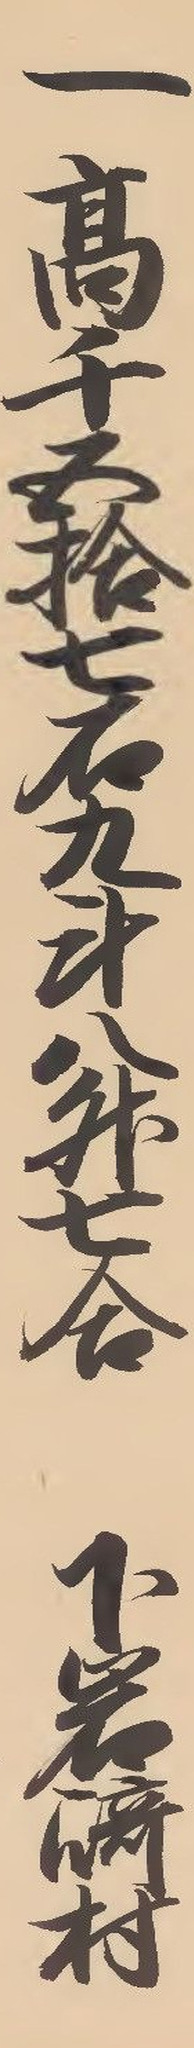一高千五拾七石九斗八升七合下岩崎村
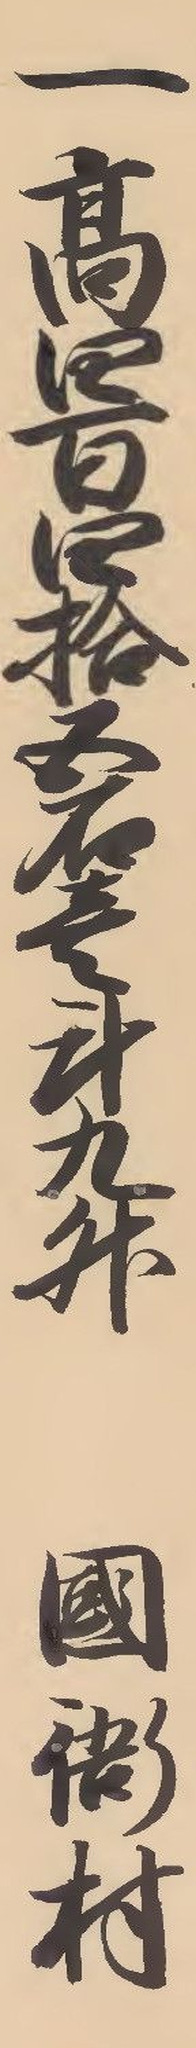一高四百四拾五石壱斗九升国衙村

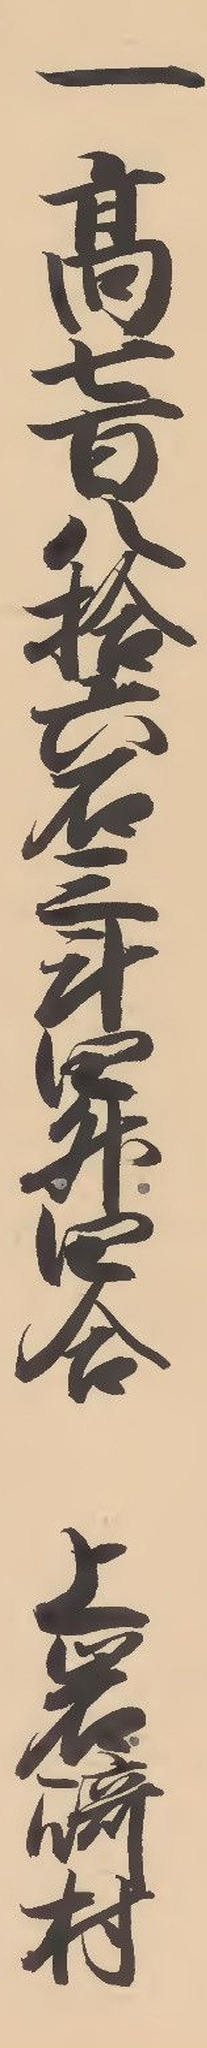一高七百八拾六石三斗四升四合上岩崎村
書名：甲斐国郷帳
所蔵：国立公文書館 National Archives of Japan
